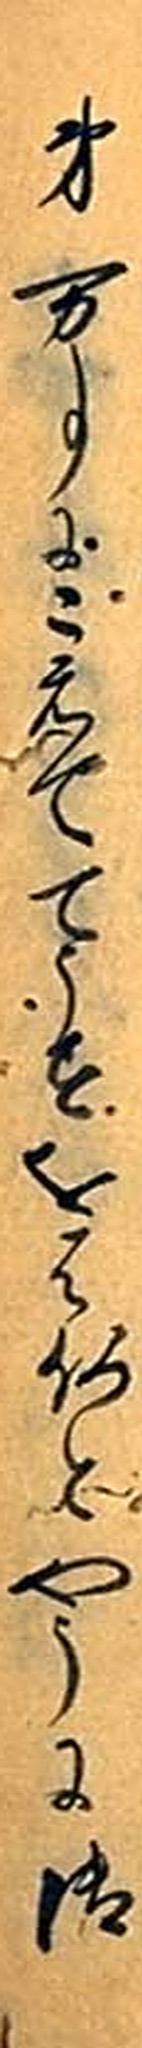弟万事にこえててうすをは何とやうに御

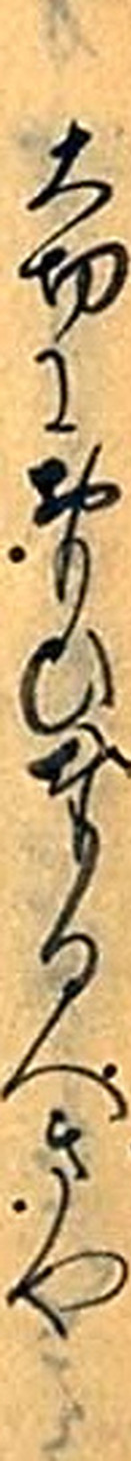大切におもひ奉るへきや
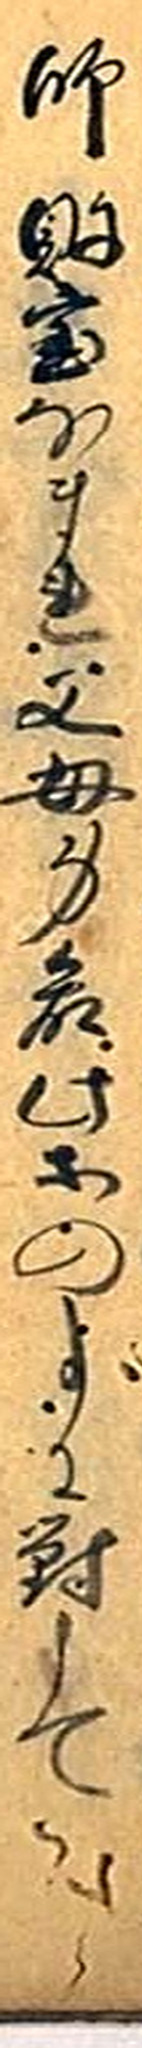師財宝ほまれ父母身命此等の事に対して
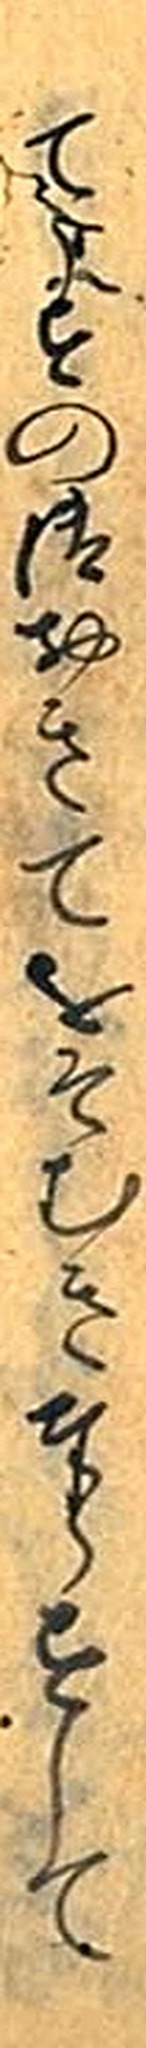てうすの御おきてをそむき奉らすして
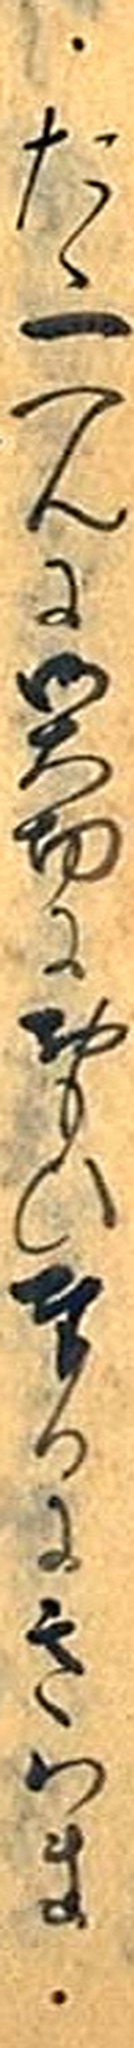たゝ一へんに御大切におもひ奉るにきはま
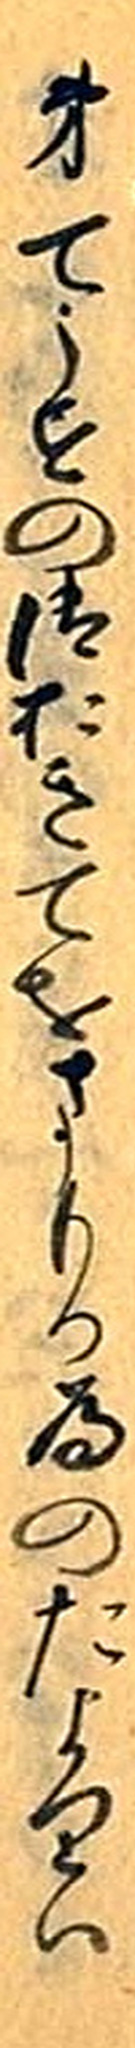弟てうすの御おきてをまもる為のたよりは
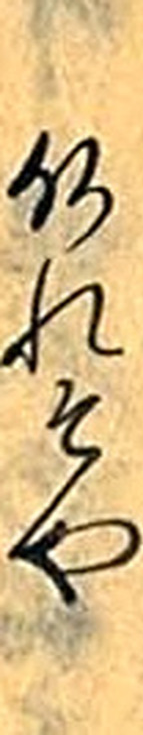何れそや
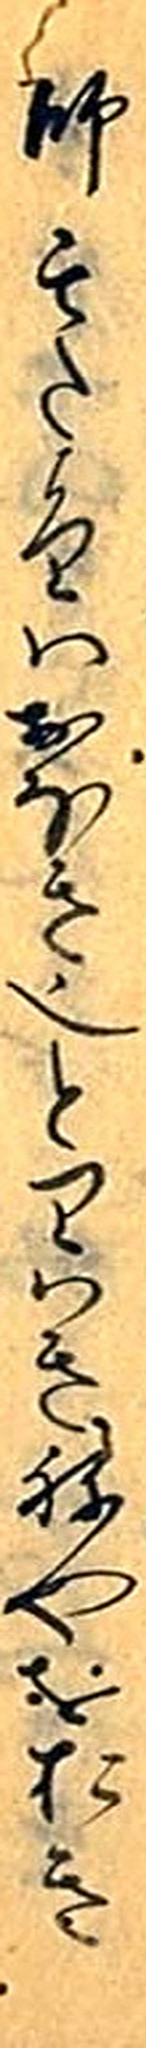師其たよりはおほき也とりはきねやをおき
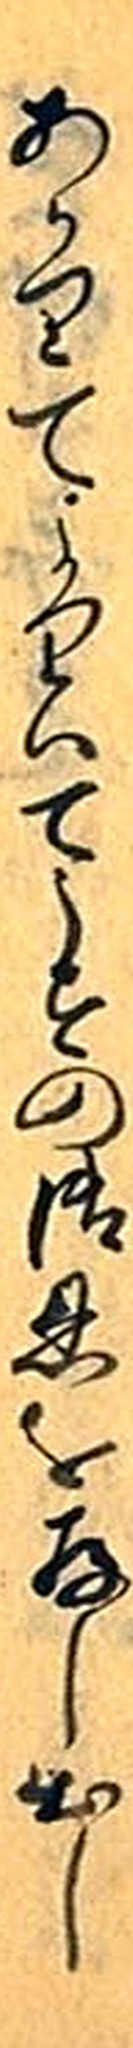あかりてよりはてうすの御恩を存し出し
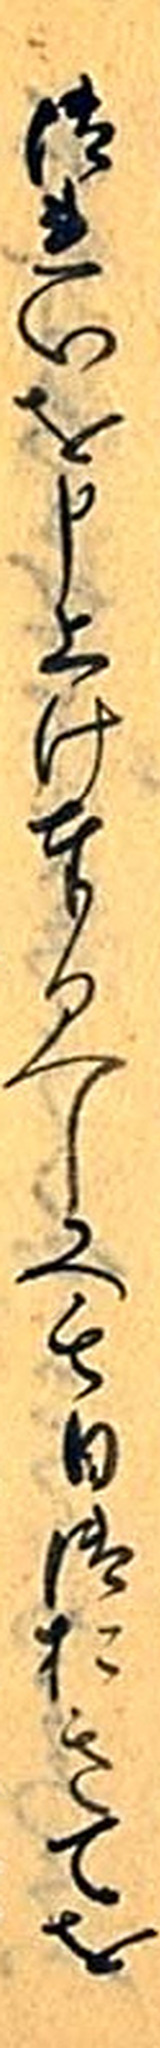御れいを申上け奉るへし又其日御おきてを
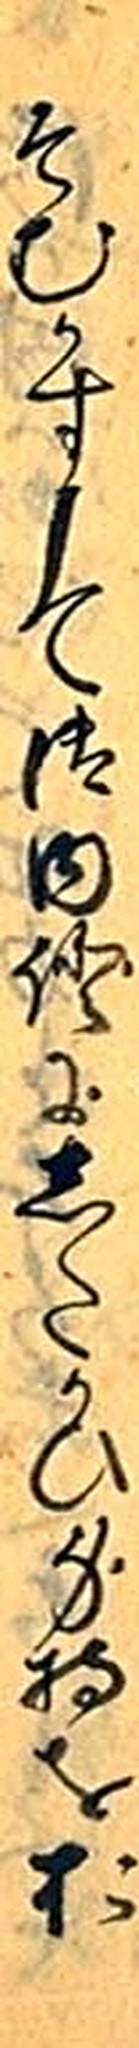そむかすして御内證にしたかひ身持をお
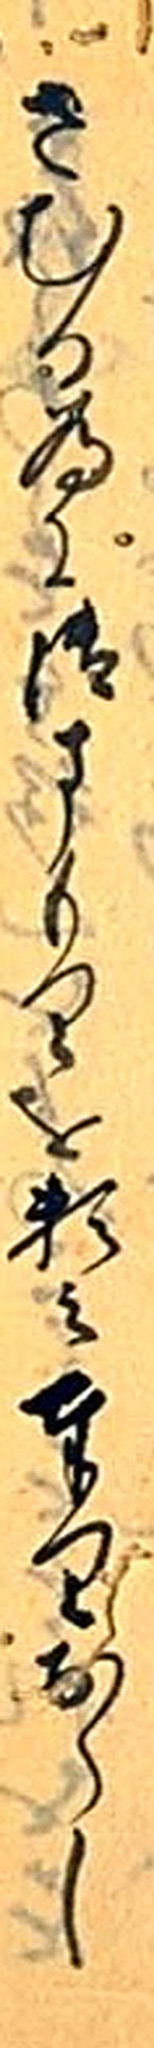さむる為に御まもりを頼み奉りおらし
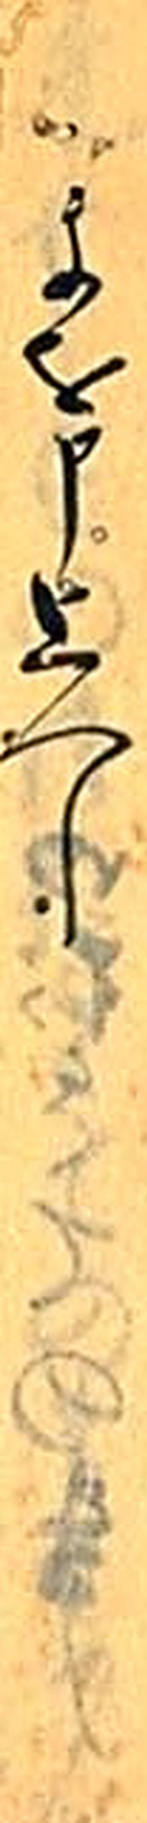よを申上へし
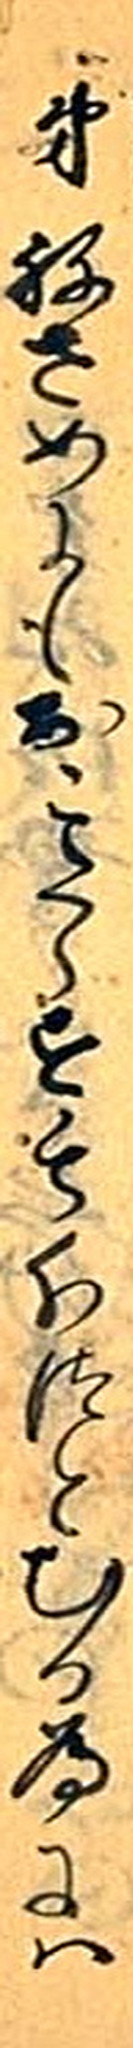弟ねさめにもおこたらす其外つとむる為には
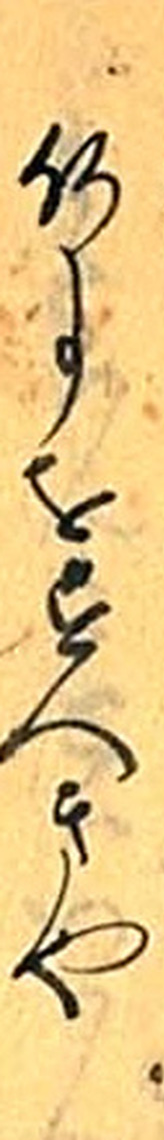何事をすへきや
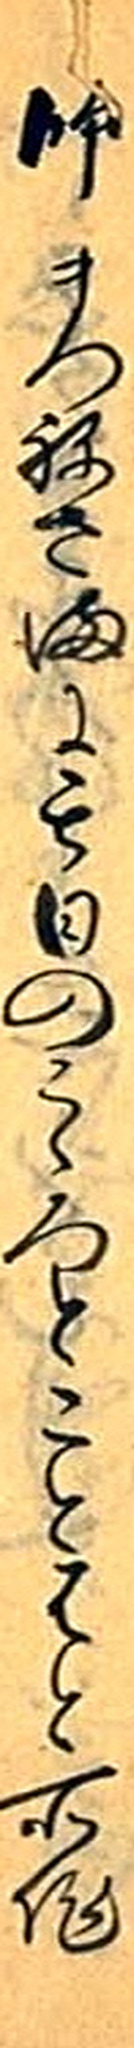師まつねさまに其日のこゝろとことはと所作
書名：ドチリナ・キリシタン
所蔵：東京大学総合図書館 / General Library in the University of Tokyo
